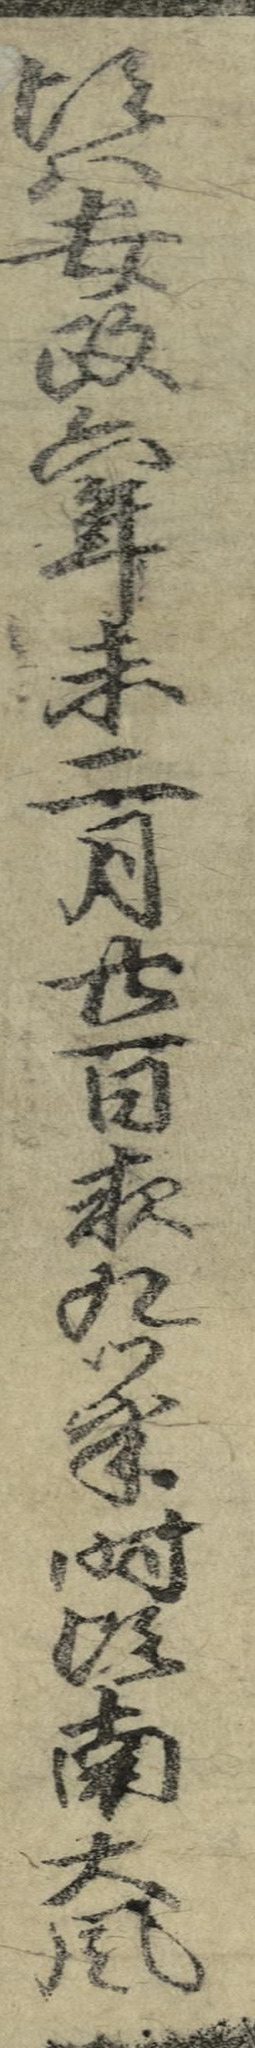頃は安政六年未二月廿一日夜九ツ半時頃南大風
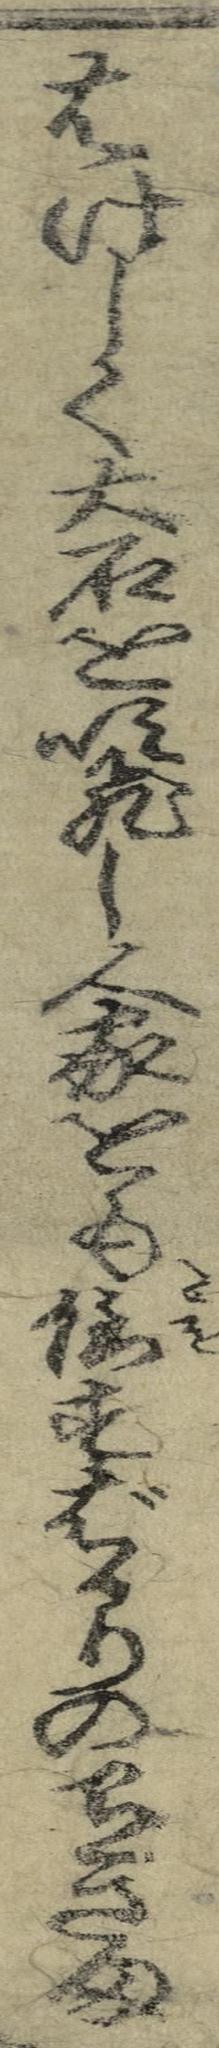はけしく大石を吹飛し人家とも倒すばかりの有さま
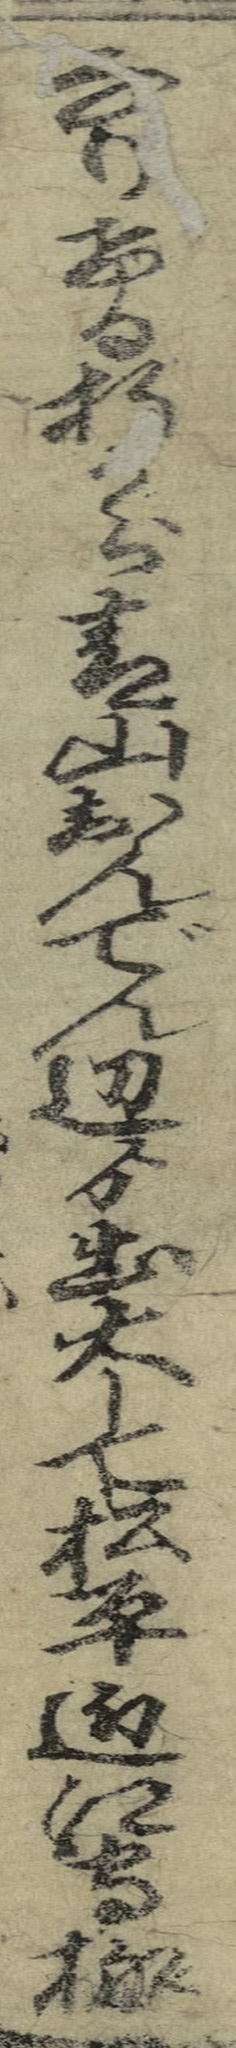なりける折から青山おんでん辺より出火して松平近江守様
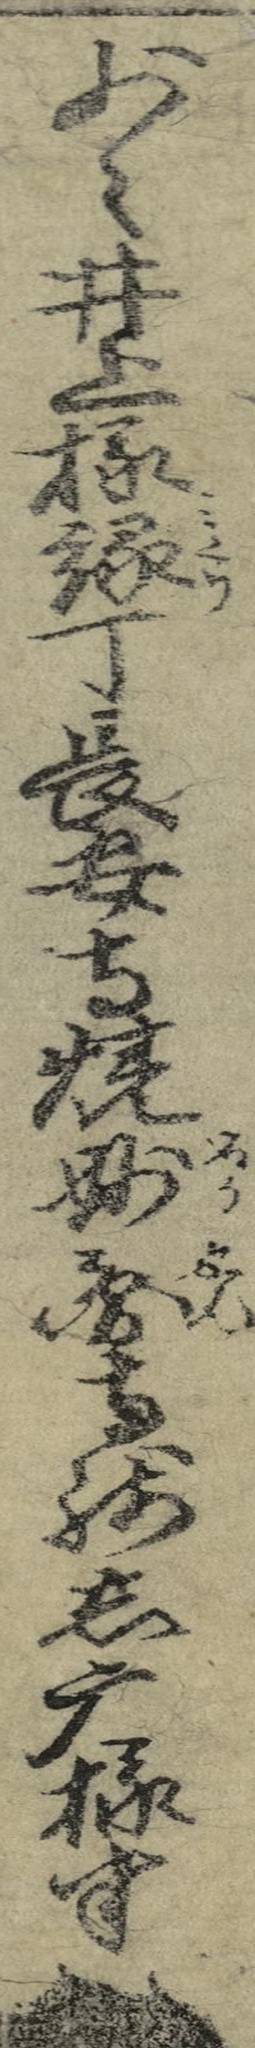少〻井上様緑丁長安寺焼妙円寺残志摩様半
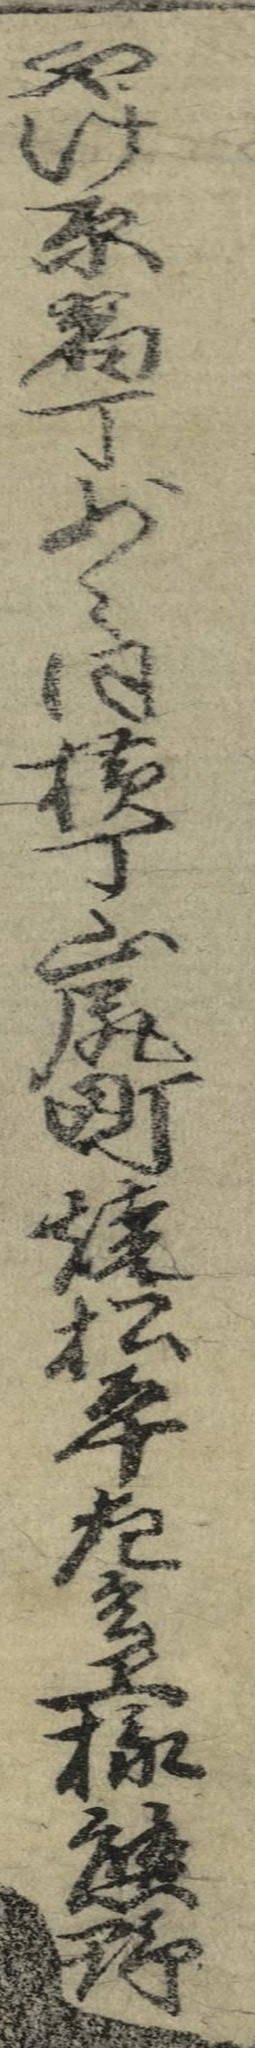やけ原宿丁少〻同横丁山尻町焼松平左兵衛様熊野
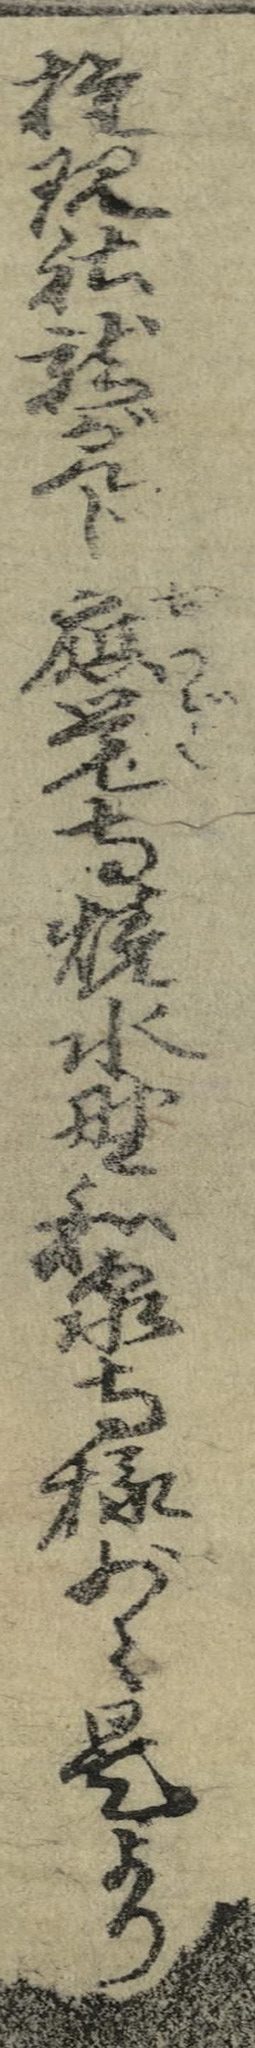権現社龍がんじ応覚寺焼水野和泉守様少々是より
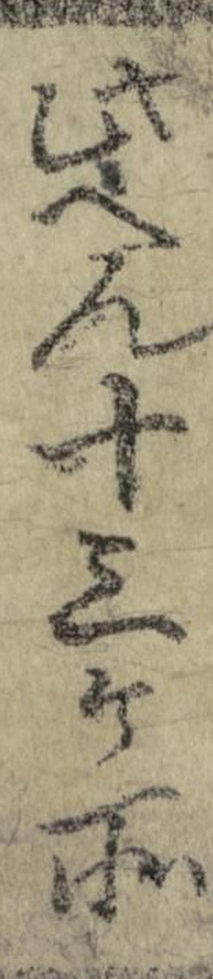此へん十三ヶ所
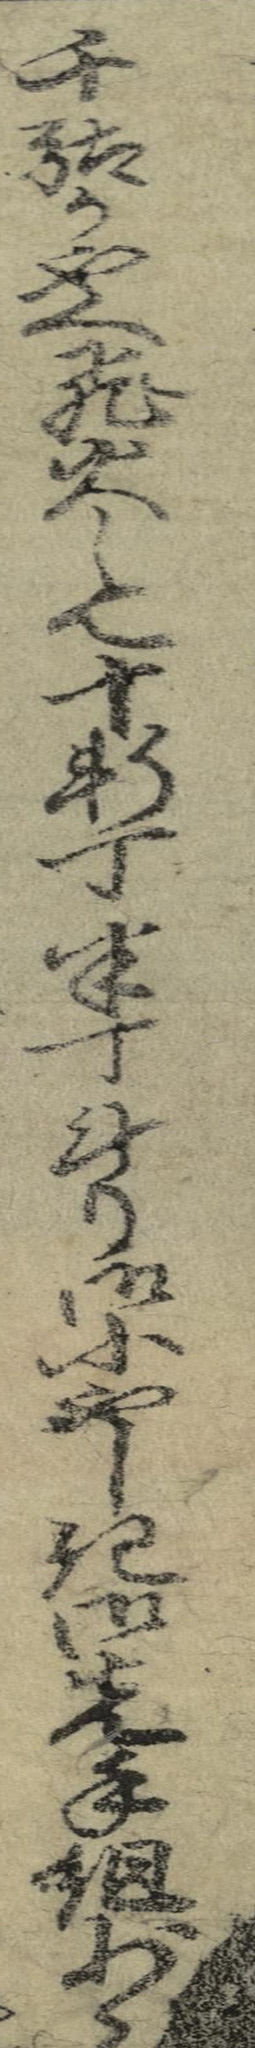千駄ヶやへ飛火して十軒丁半町丁斗り御小やしき御先手組少々
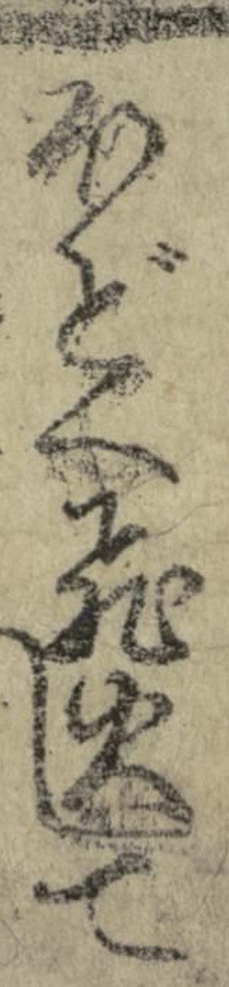ほどへ飛火して
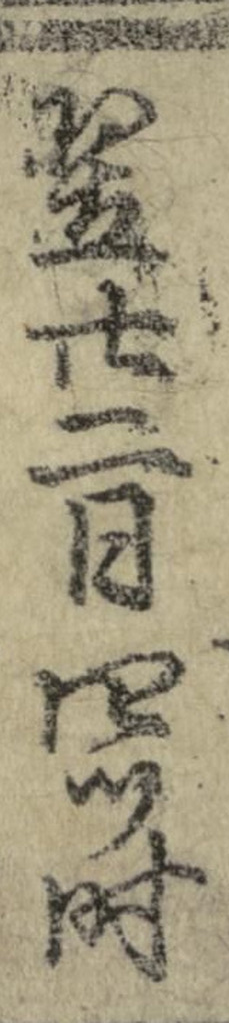翌廿二日四ッ時
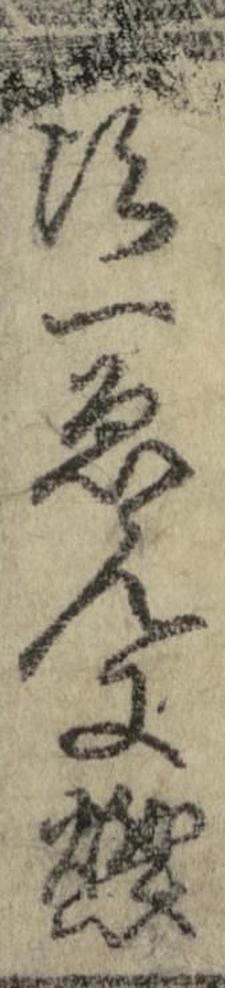頃一ゑんに燃
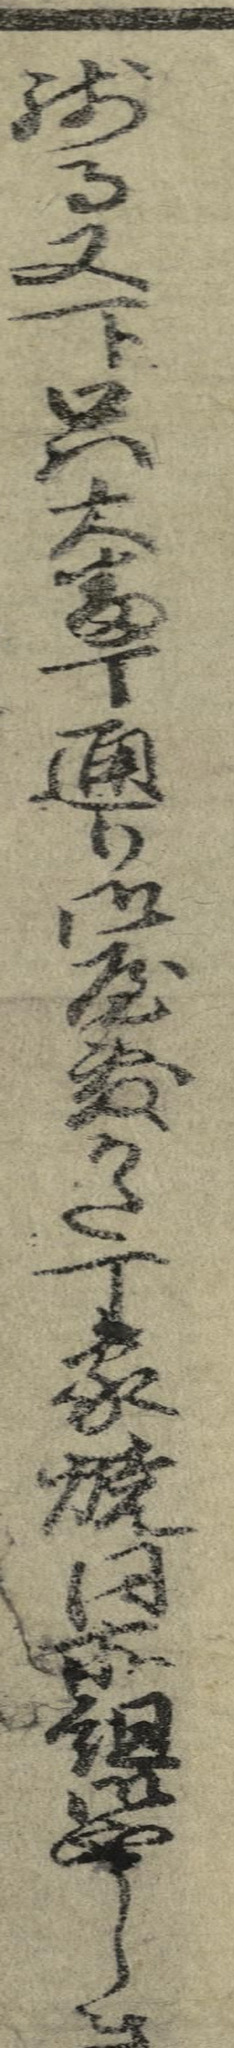残る又一ㇳ口ハ大番丁通り御屋敷かた丁家焼同所御組やしき
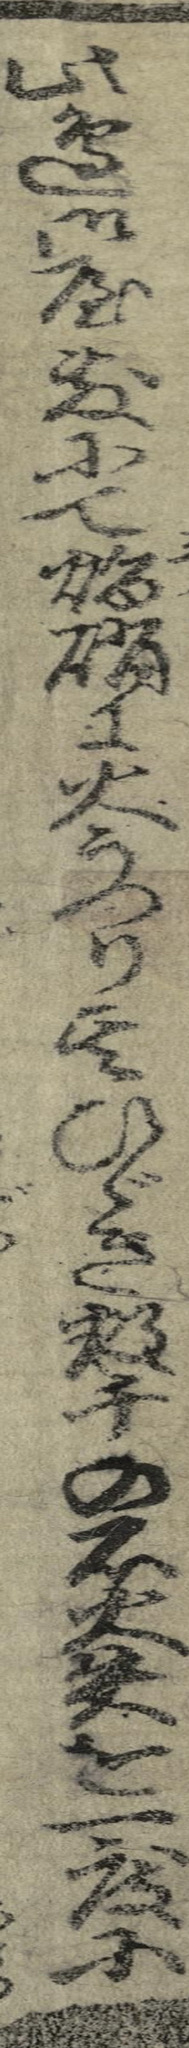此辺御屋敷にて焔硝に火うつり其ひゞき数千の石火矢を一度に
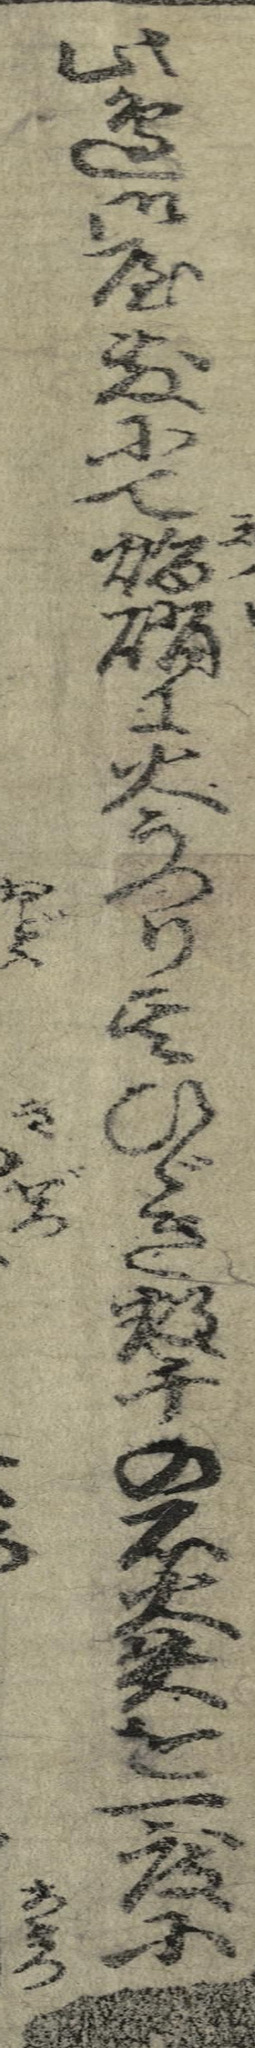此辺御屋敷にて焔硝に火うつり其ひゞき数千の石火矢を一度に
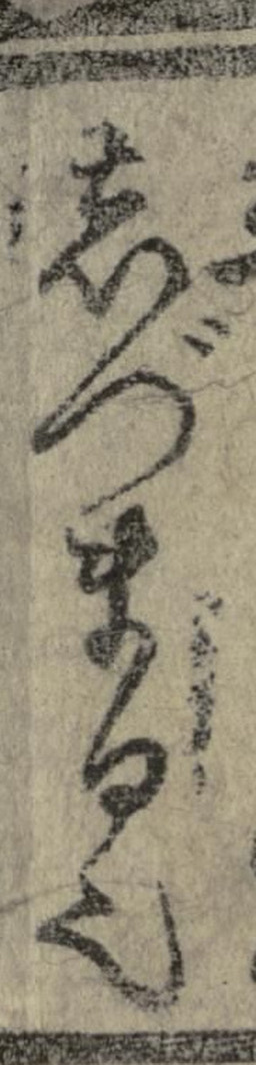しづまる也
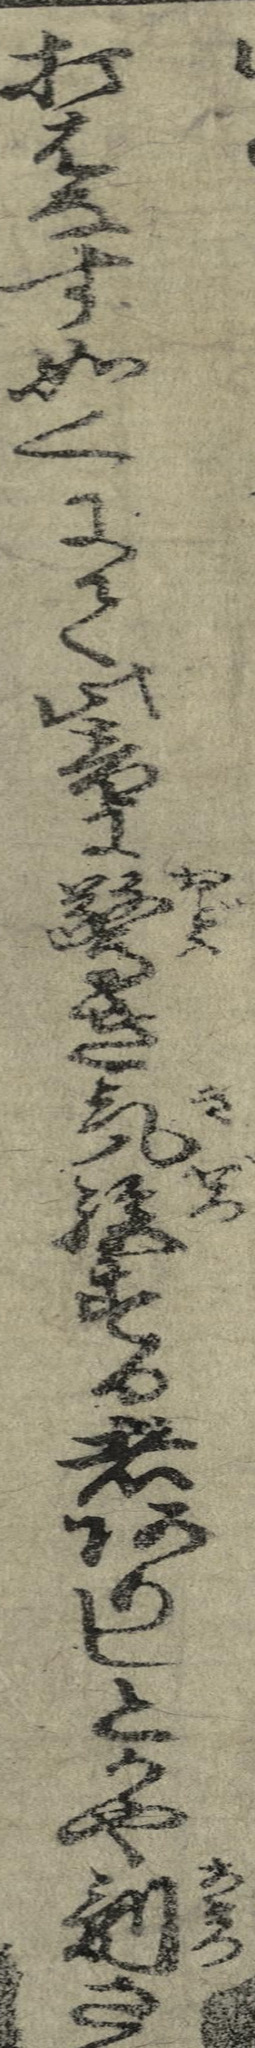打はなす如くにて此音に驚き気絶する者ありしとかや剰さへ
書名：安政六未歳二月廿一日青山大火場所附
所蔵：東京大学地震研究所図書室 Earthquake Research Institute Library, The University of Tokyo, JAPAN
